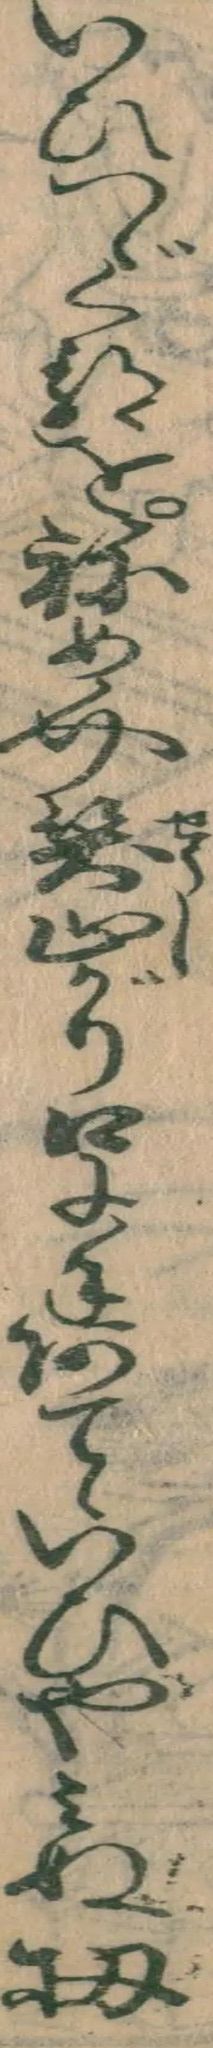いひつゞくるを。ねめ介笑止がり口に手あてゝいひやみぬ扨
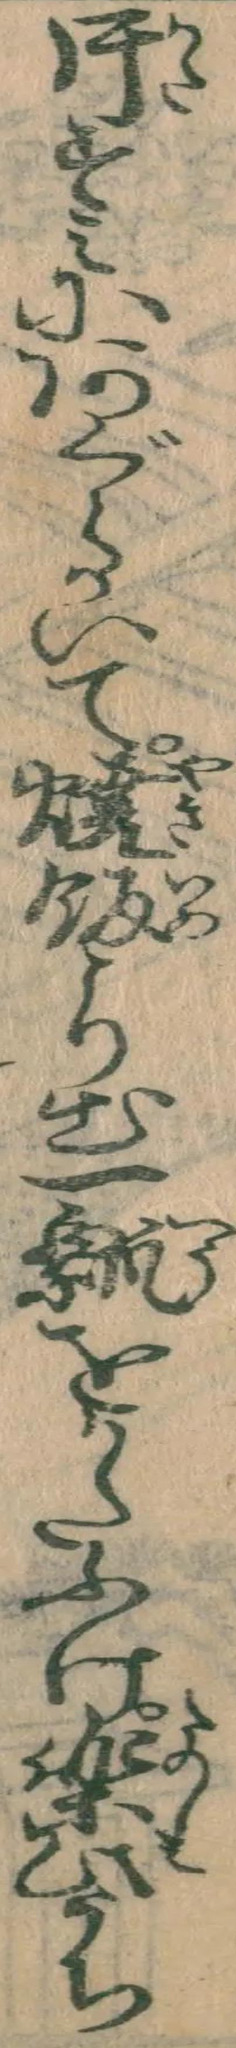片すみにあぐらかいて。焼飯とり出一瓢をかたふけ。楽此うち
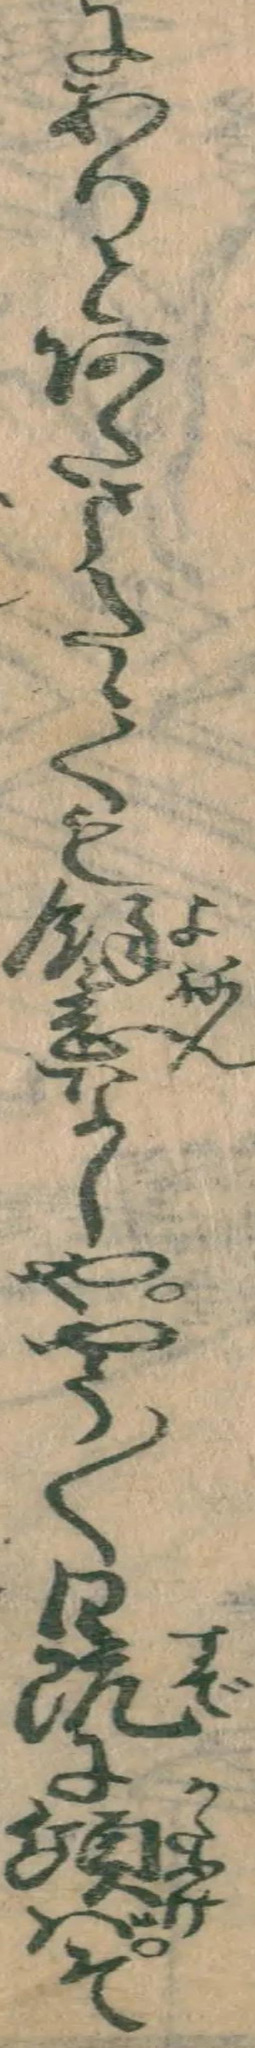にありとあたまたゝくも余念なしや。やう〳〵日既に傾ば。そ
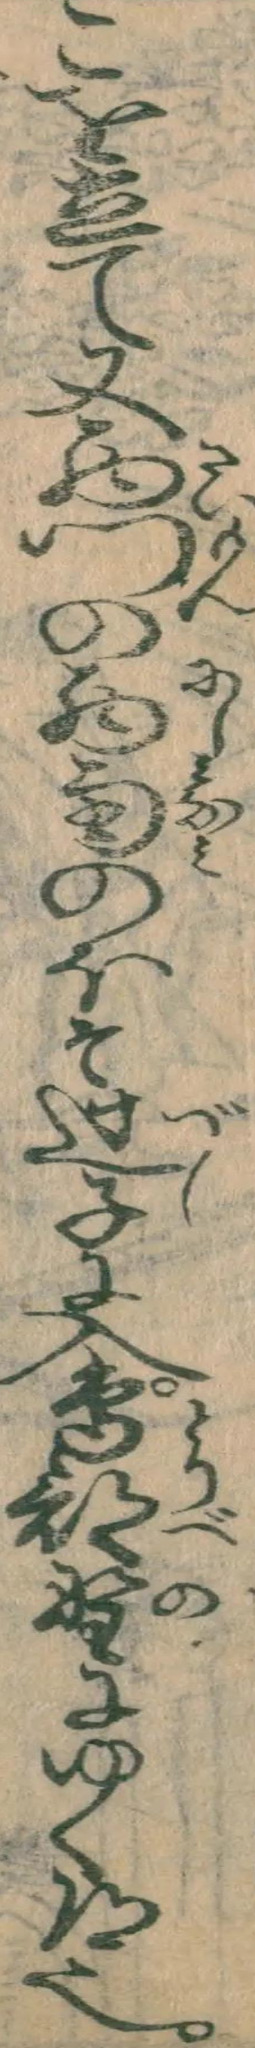こを立て又西門の西南のほそ辻子に入。鳥部野にゆく道也。
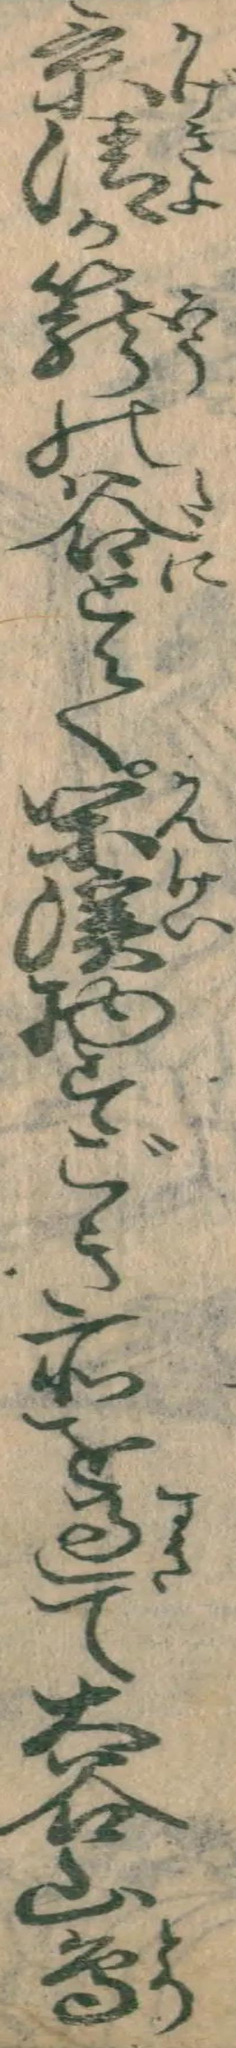景清か篭の谷とて。閑渓物すごき所を過て大谷山鳥
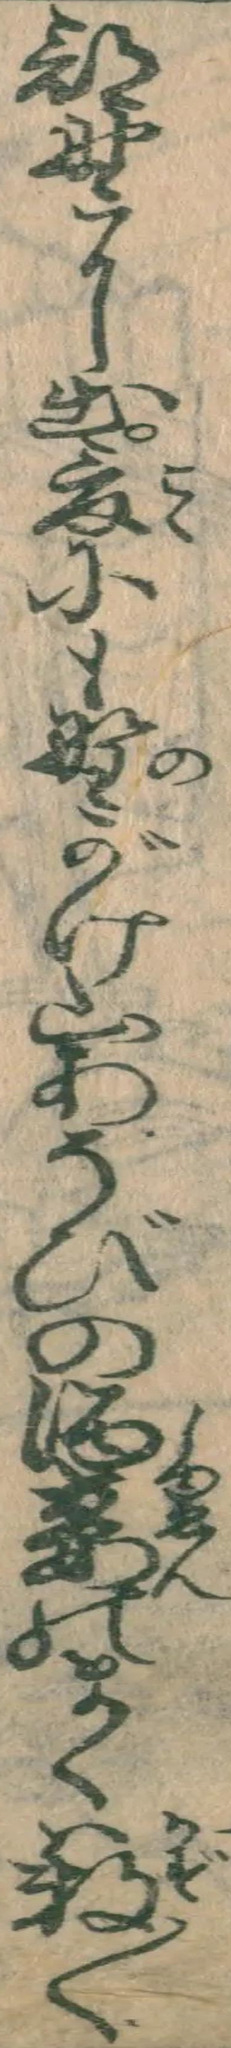部野に出。爰にも野がけ山あそびの酒宴のまくは数々
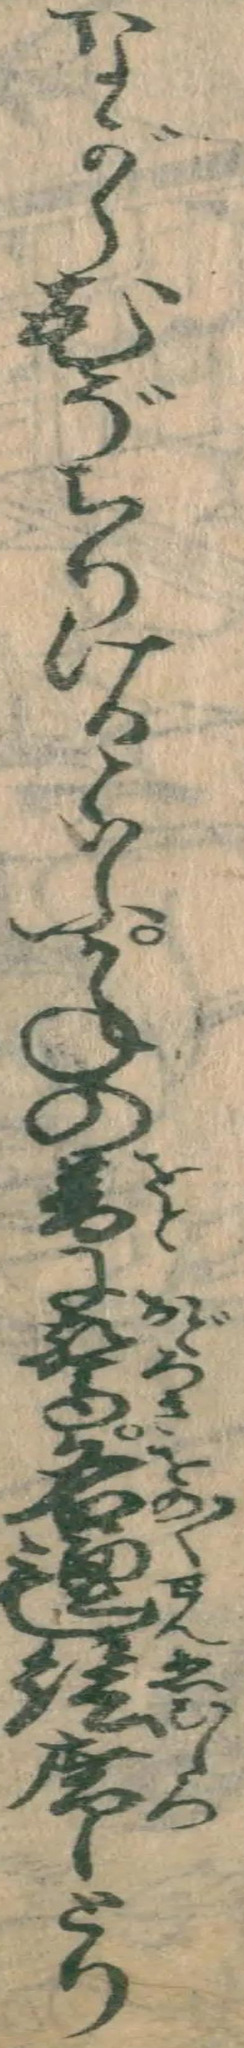ながら花ぞちりけるといふ。かねの音に驚。各氈絵蓆とり
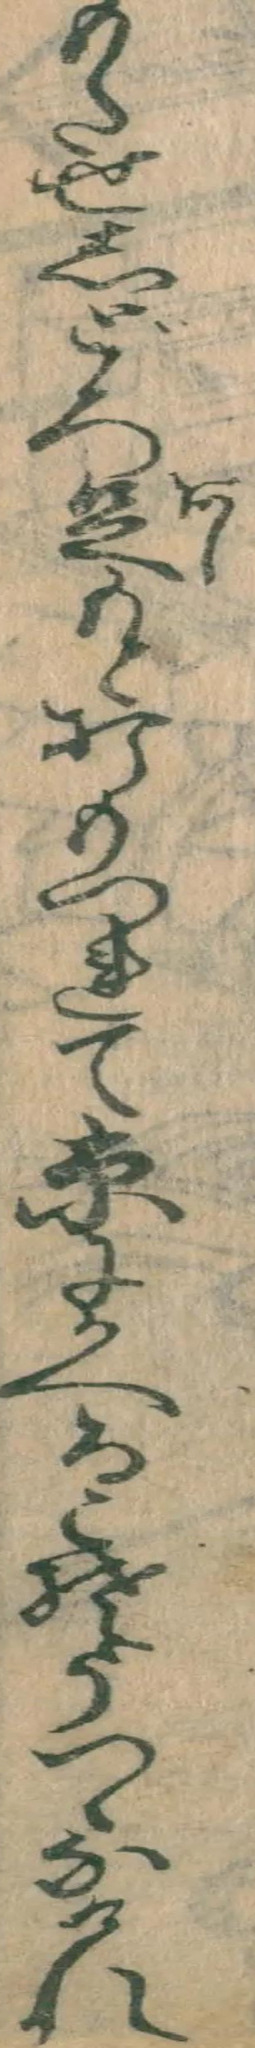もたせしどろ足もと打もつれて京にかへるこそうつゝなけれ

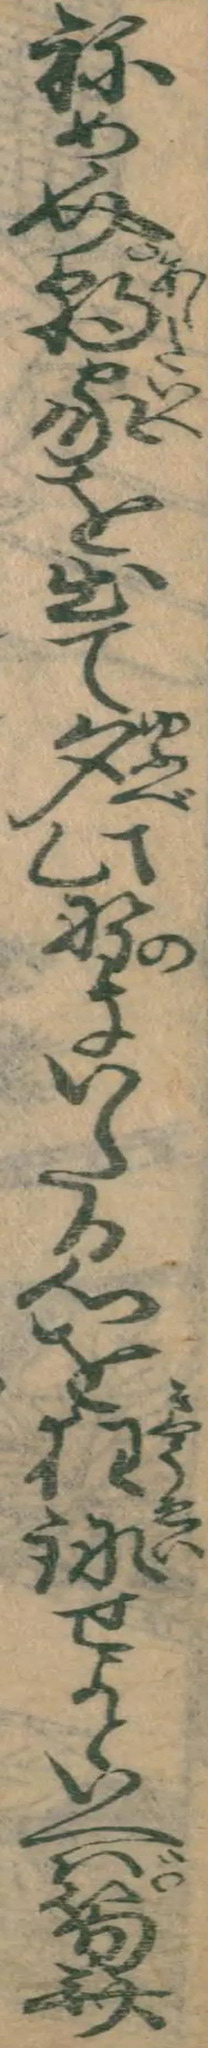ねめ介。朝家を出て夕此野にいたる心を狂詠せよといへば。筍斎
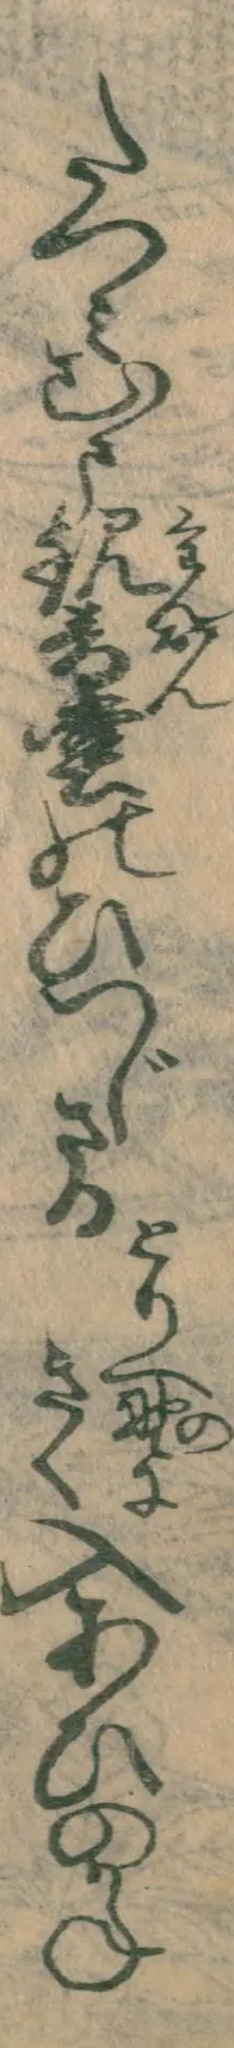たつみむに観音堂のひつじさるとりへ野にきく入あひのかね
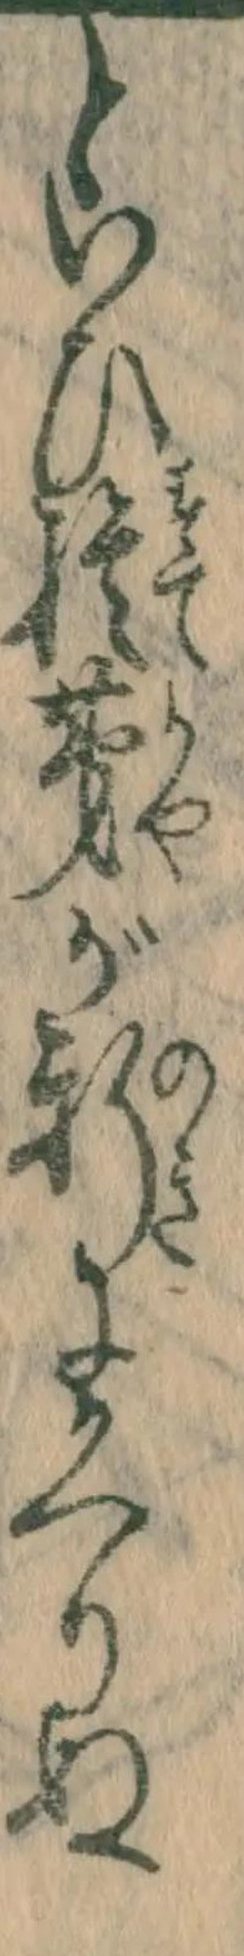といひ捨茅が軒にかへりぬ
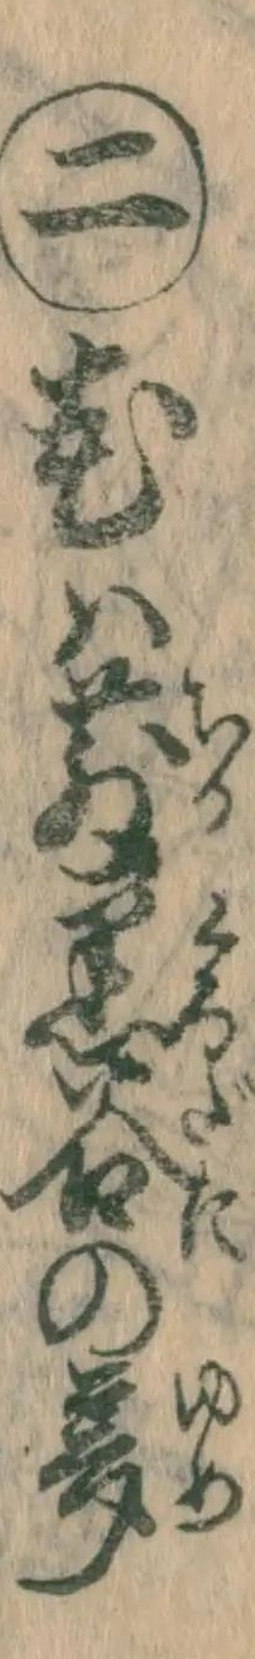二花は散黒谷の夢
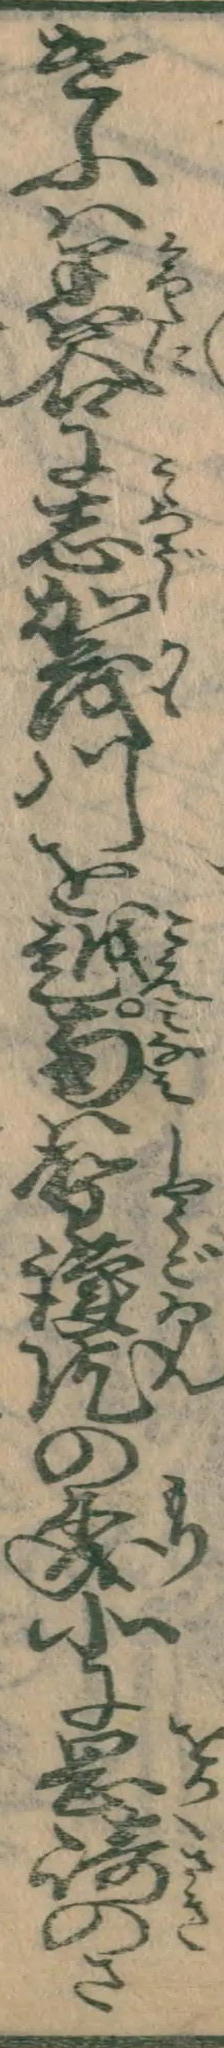けふは黒谷に志加茂川を越。南は聖護院の森北に岡崎のさ
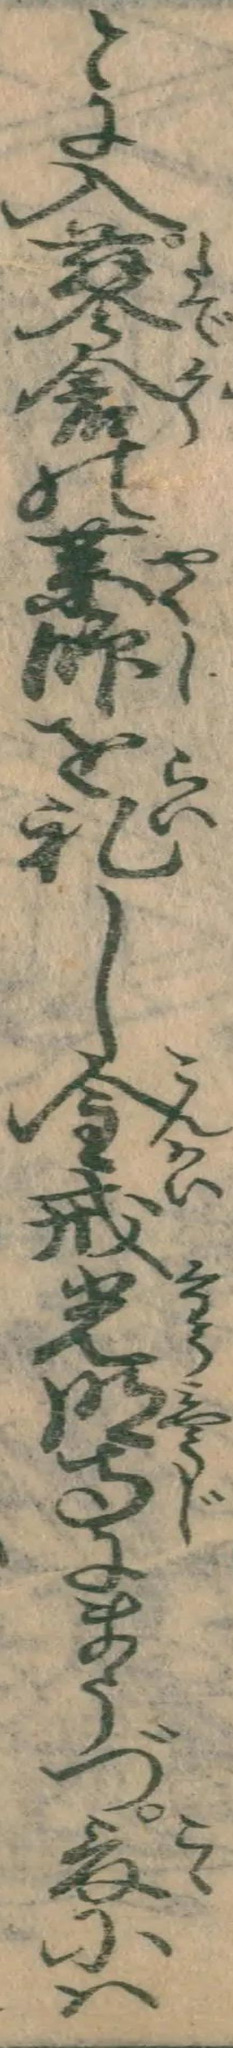とに入。蓼倉の薬師を礼し金戒光明寺にまうづ。爰には
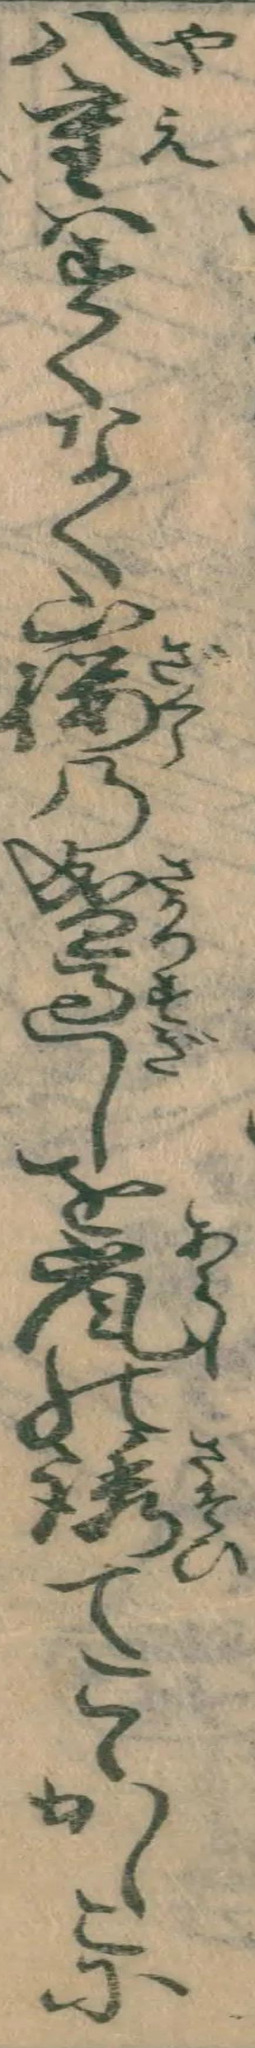八重はすくなく山桜の盛過しを嵐の誘てこゝかしこに
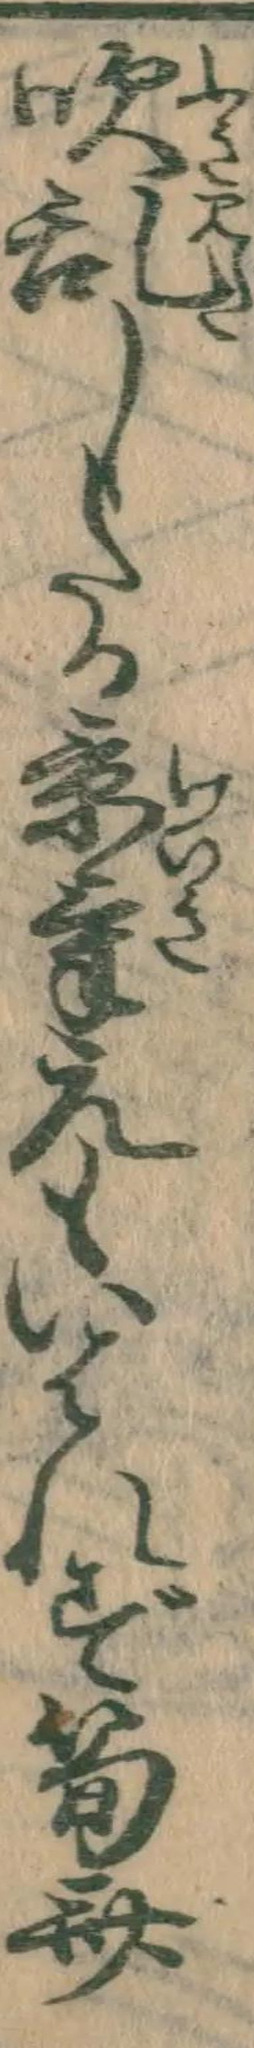吹乱したる景気えもいはれず筍斎
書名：新竹斎 5巻
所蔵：国立国会図書館 National Diet Library, JAPAN
